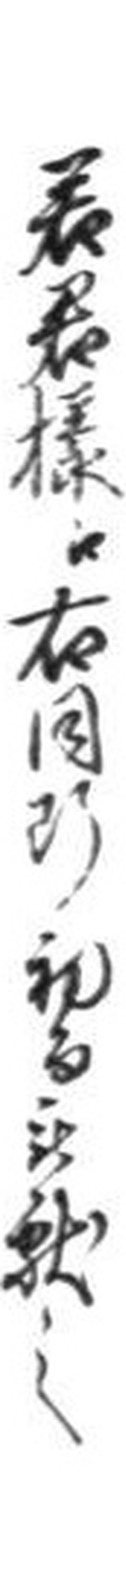若君様江右同断初而被献之
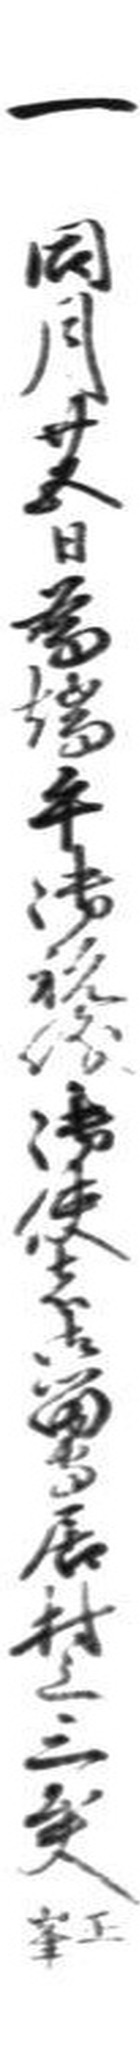一同月廿五日為端午御祝儀御使者御留守居村上三大夫正峯
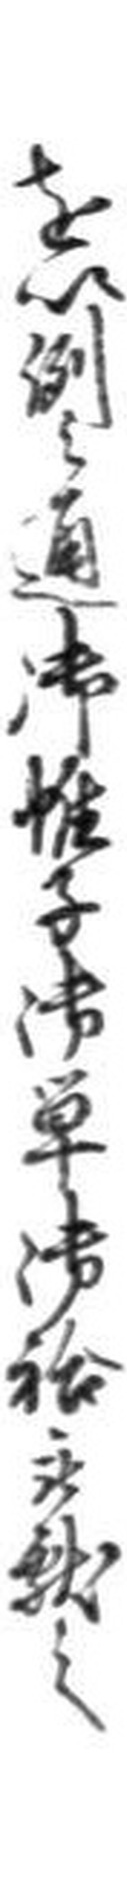を以例之通御帷子御単御袷被献之
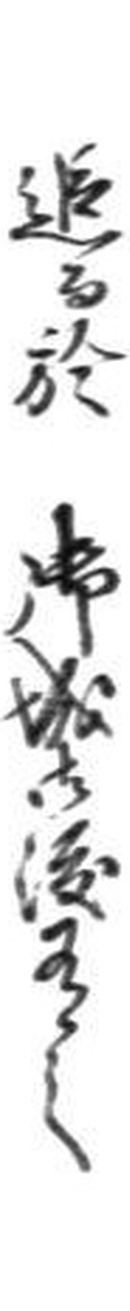追而於御城御渡有之
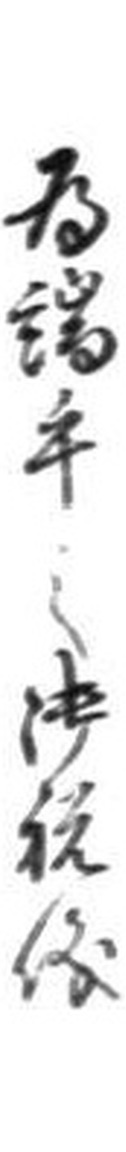為端午之御祝儀
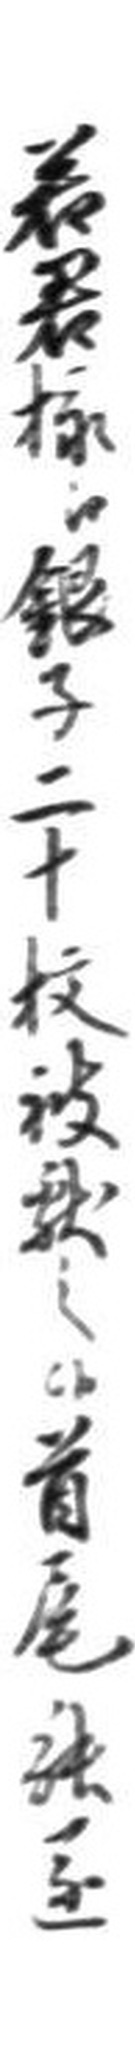若君様江銀子二十枚被献之候首尾能遂
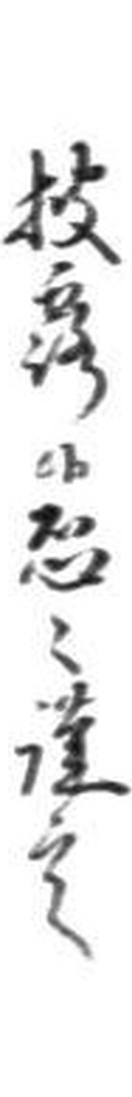披露候恐々謹言
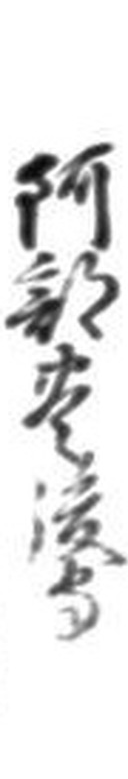阿部豊後守
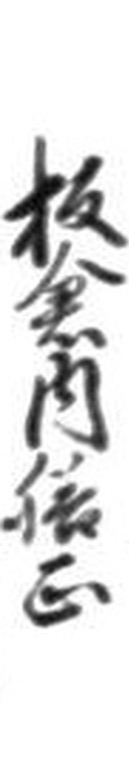板倉内膳正
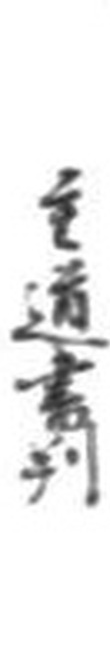重道書判

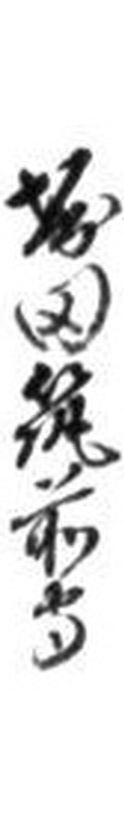堀田筑前守
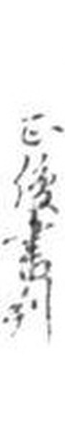正俊書判
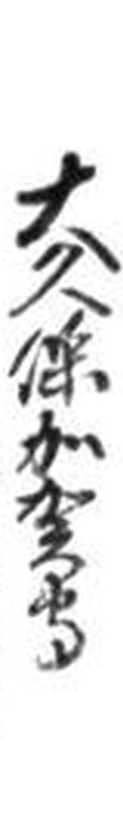大久保加賀守
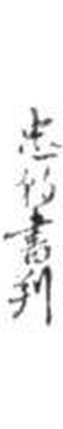忠朝書判
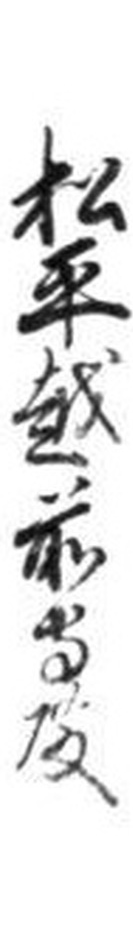松平越前守殿
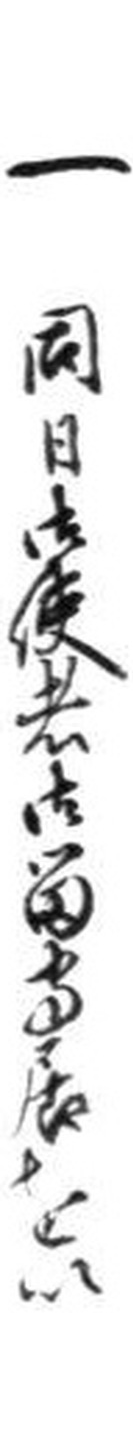一同日御使者御留守居を以
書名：家譜 十五 綱昌公 従天和元年到元禄十二年
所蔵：福井県文書館 Fukui Prefectural Archives
